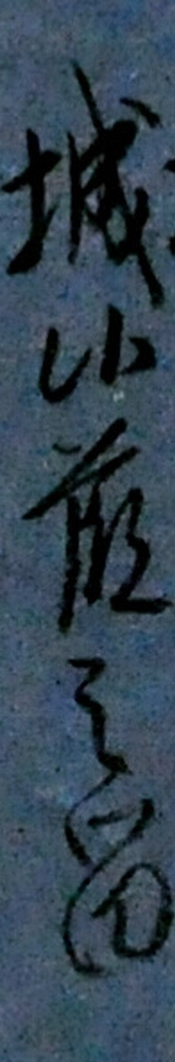城候節之留
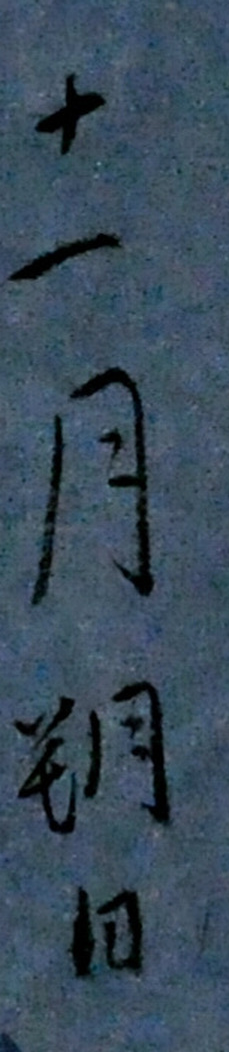十一月朔日
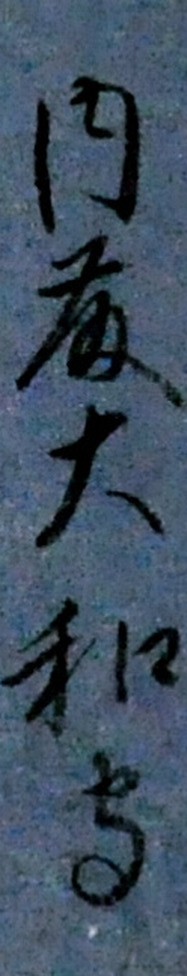内藤大和守

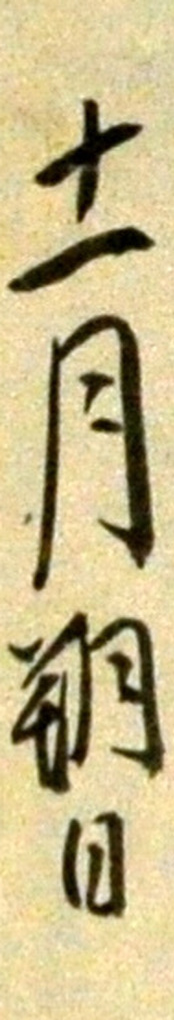十一月朔日
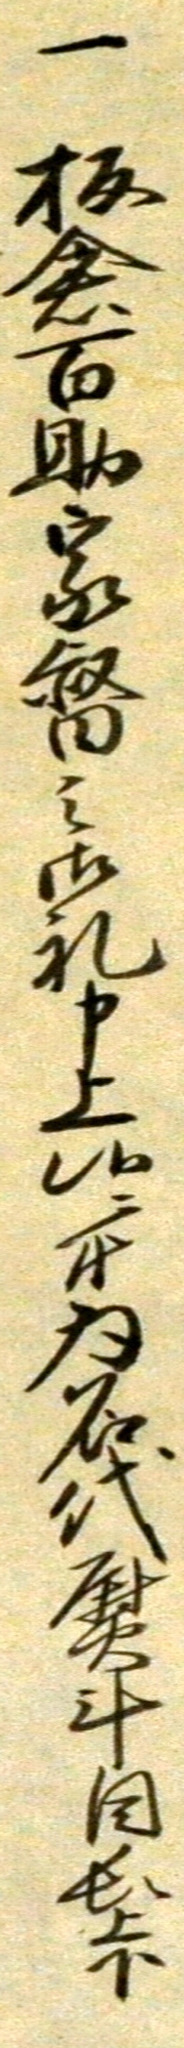一板倉百助家督之御礼申上候ニ付為名代熨斗目長上下
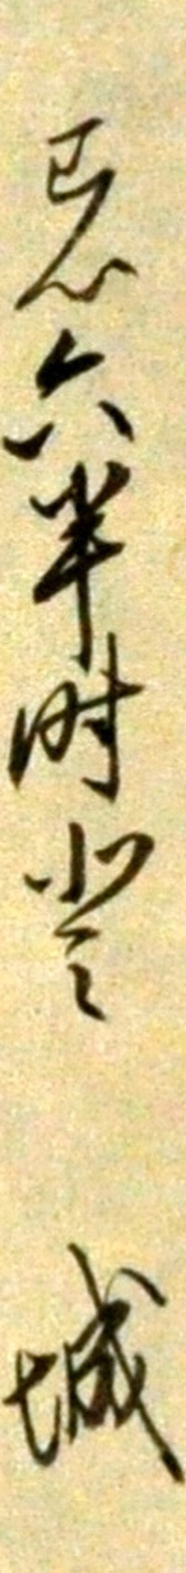着六半時登城
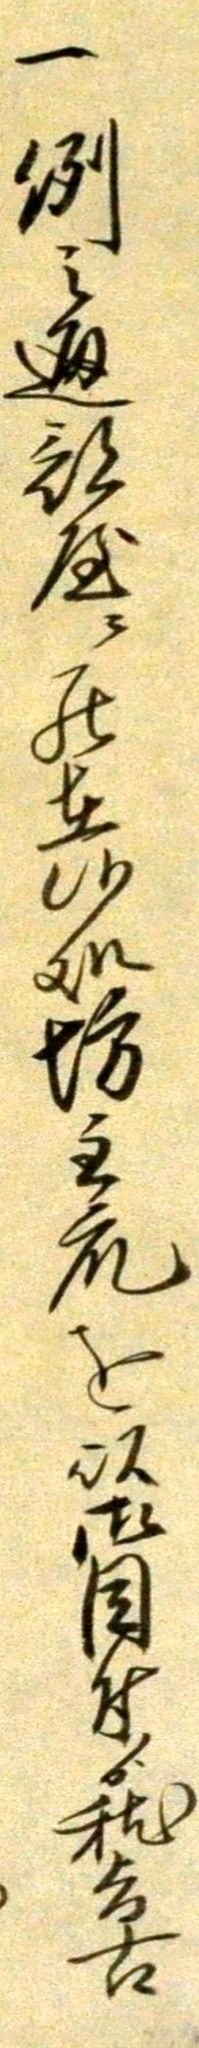一例之通部屋ニ罷在候処坊主衆を以御目付ゟ稽古
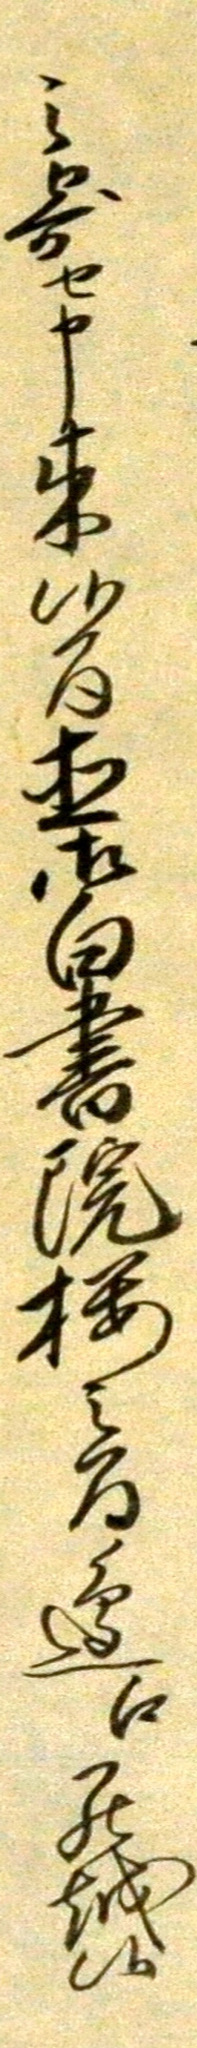之寄セ申来候間直御白書院桜之間辺え罷越候
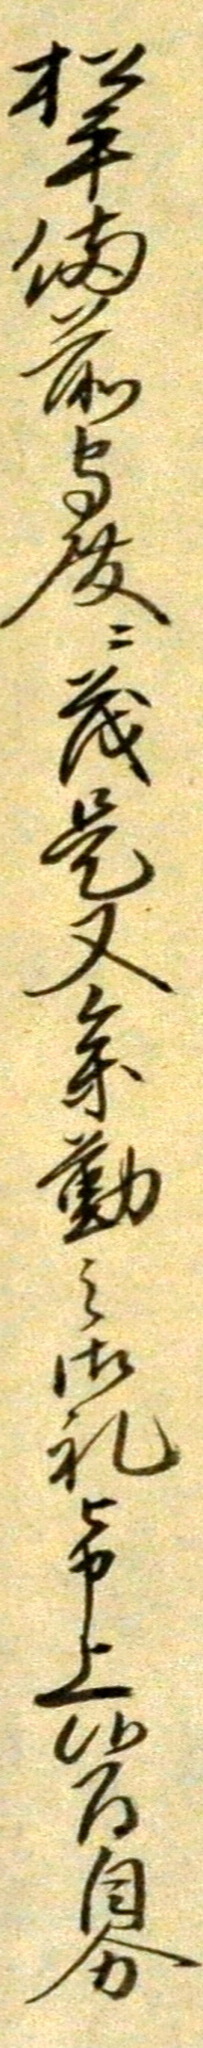松平備前守殿ニも是又参勤之御礼被申上候間自分
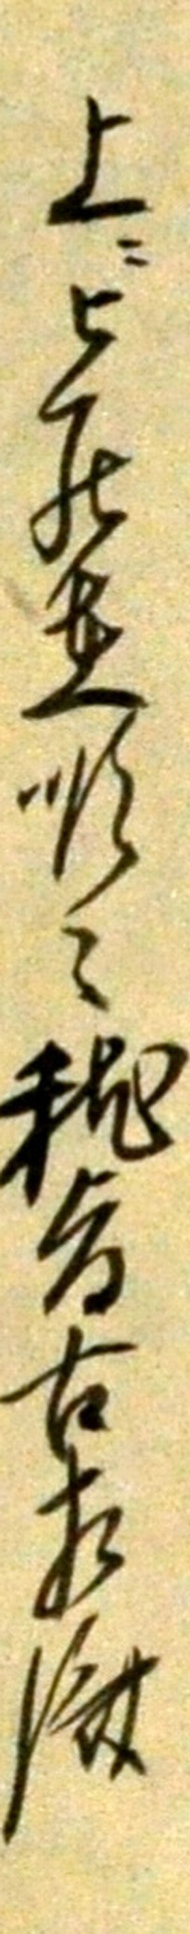上ニ被罷在順々稽古相済
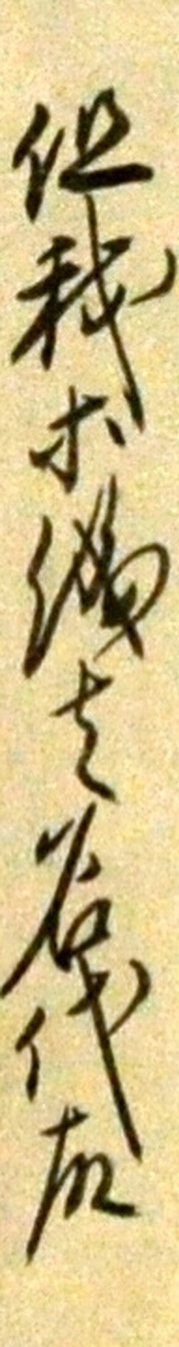但我等儀は名代故
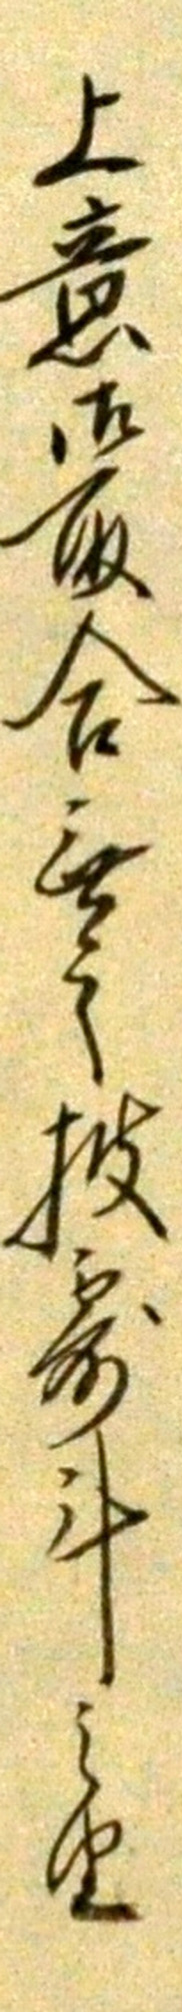上意御取合無之披露計之由
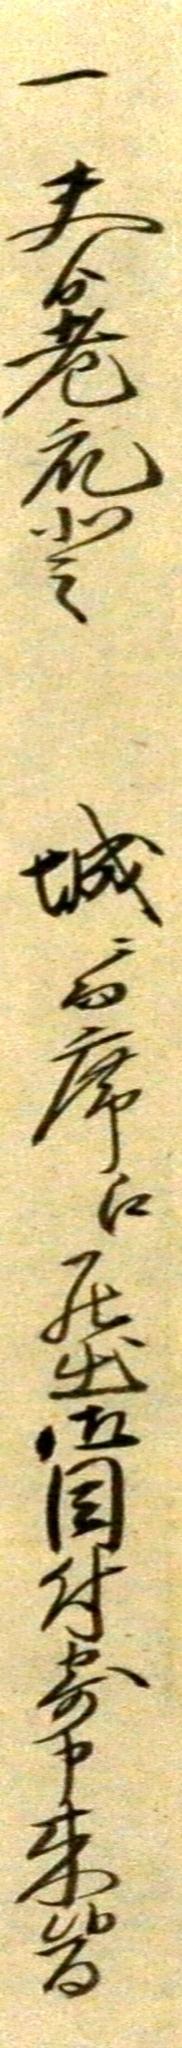一夫ゟ老衆登城ニ而席え罷出御目付寄申来候間
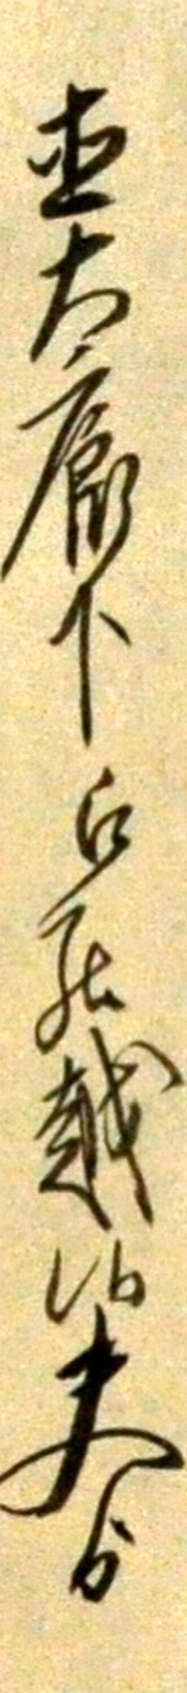直大廊下え罷越候夫ゟ
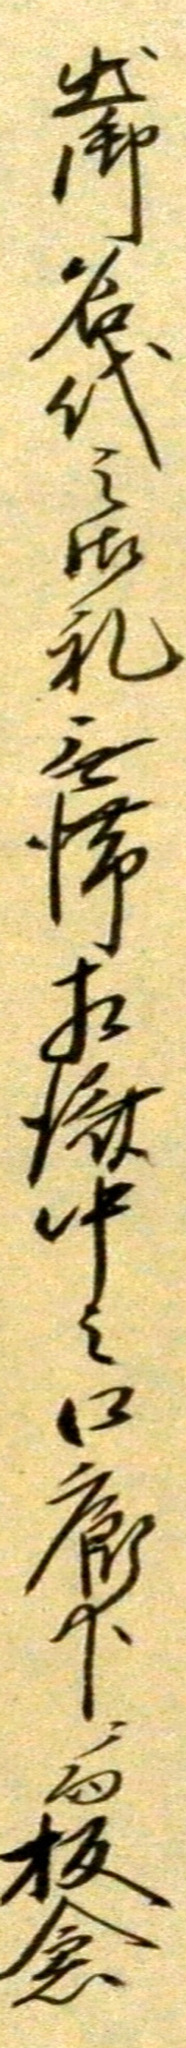出御名代之御礼無滞相済中之口廊下ニ而板倉
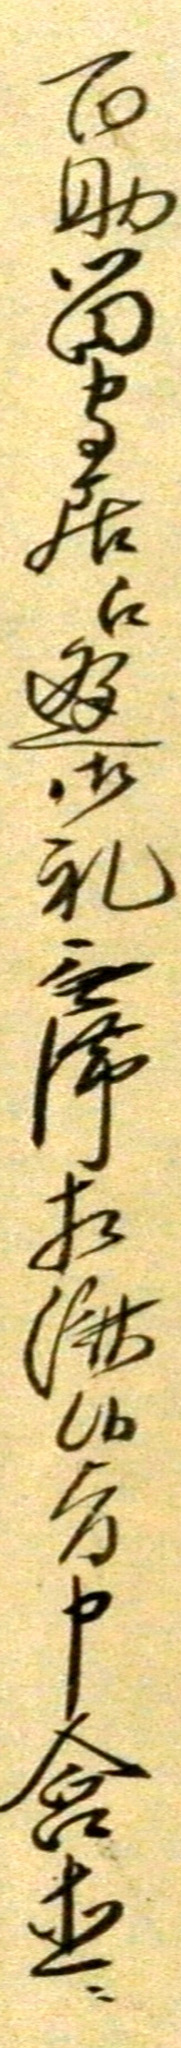百助留守居え逢御礼無滞相済候旨申含直ニ
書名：諸名代相勤候節ノ留書外
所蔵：伊那市立高遠町図書館・合同会社AMANE
